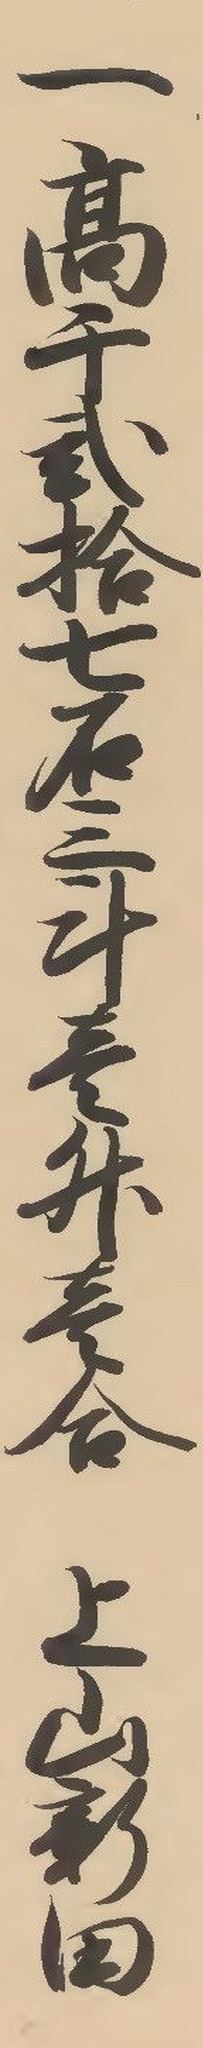一高千弐拾七石三斗壱升壱合上山新田
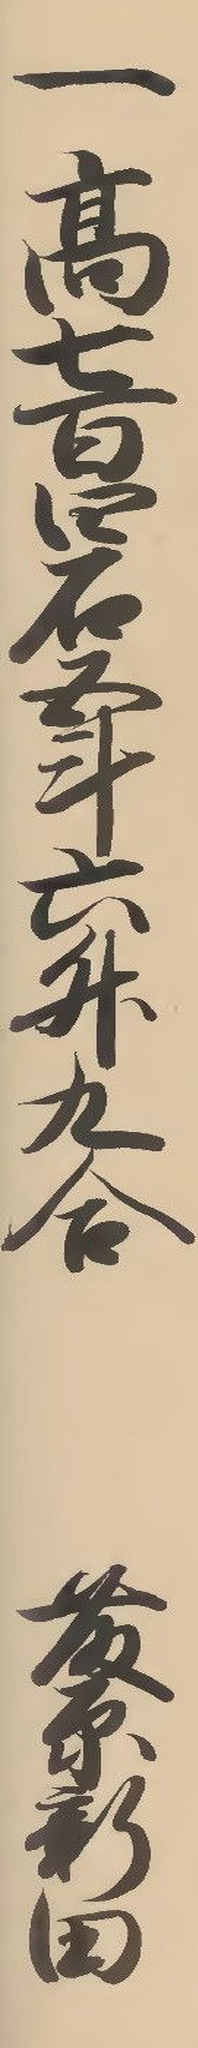一高七百四石五斗六升九合藤原新田
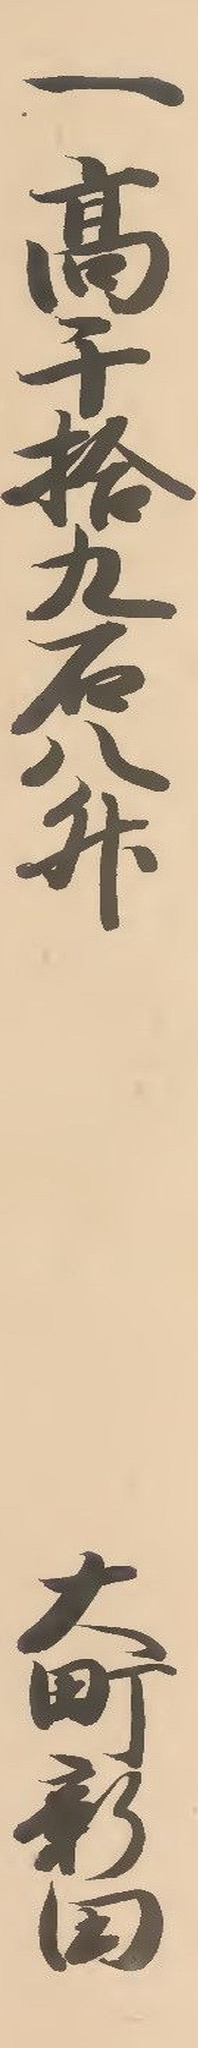一高千拾九石八升大町新田
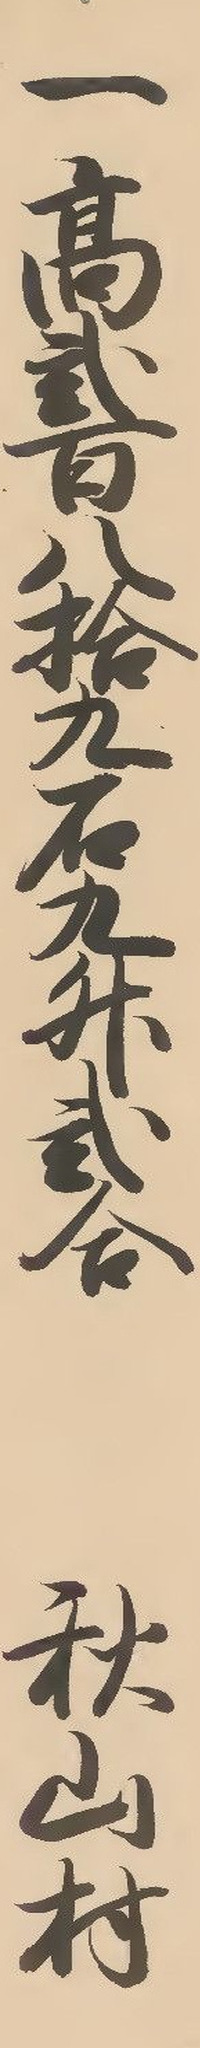一高弐百八拾九石九升弐合秋山村
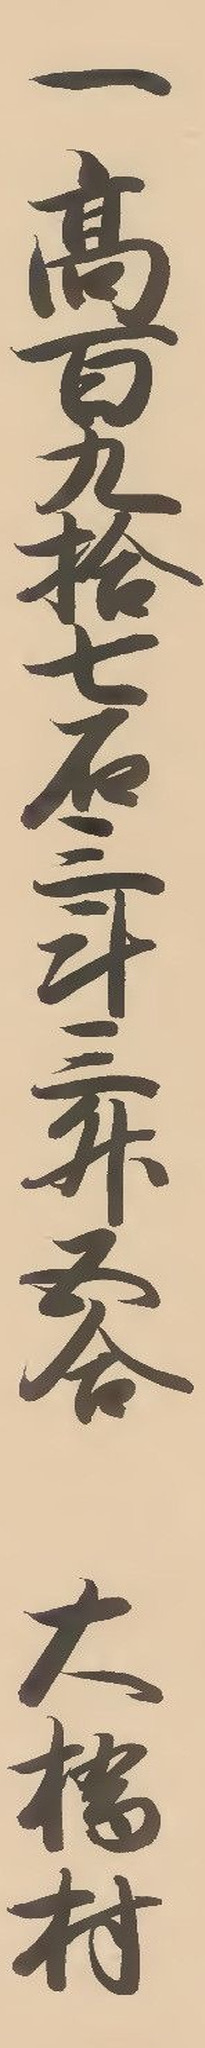一高百九拾七石三斗三升五合大橋村
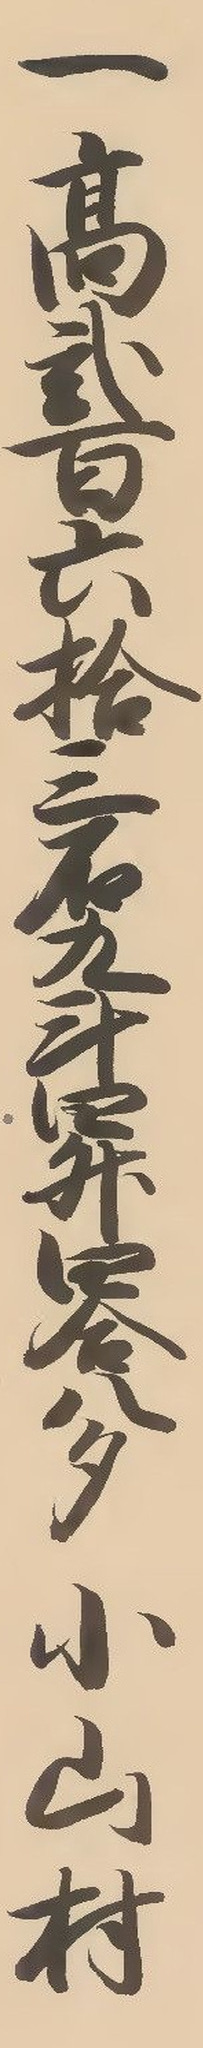一高弐百六拾三石九斗四升四合八勺小山村

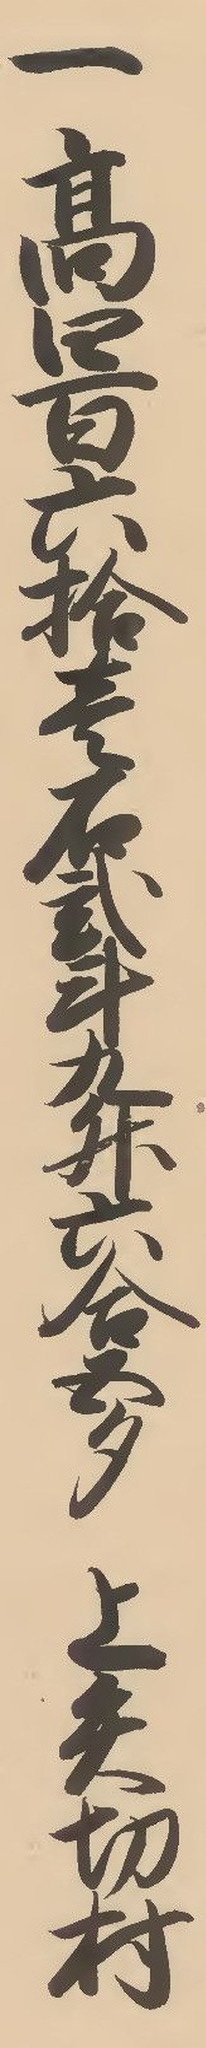一高四百六拾壱石弐斗九升六合五勺上矢切村
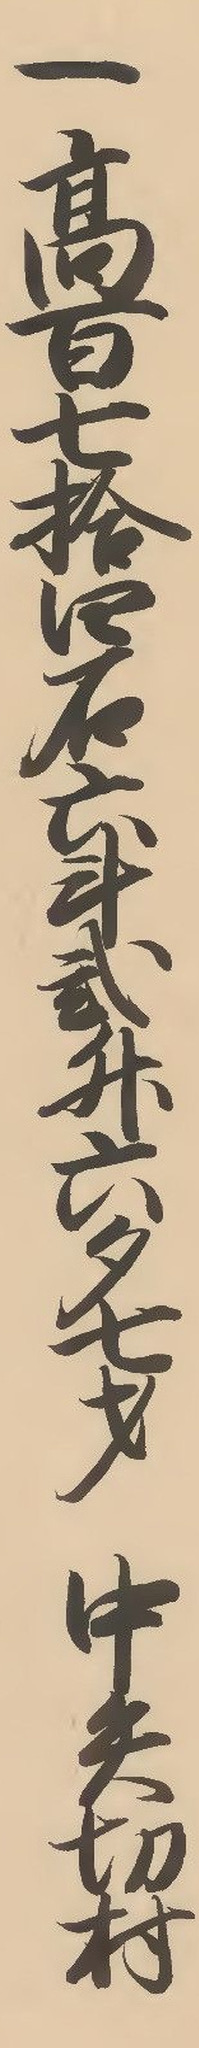一高百七拾四石六斗弐升六勺七才中矢切村
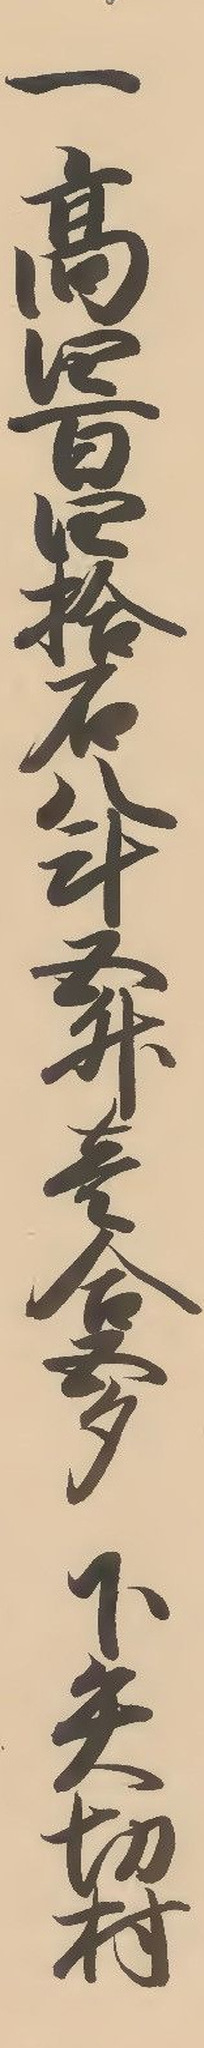一高四百四拾石八斗五升壱合五勺下矢切村
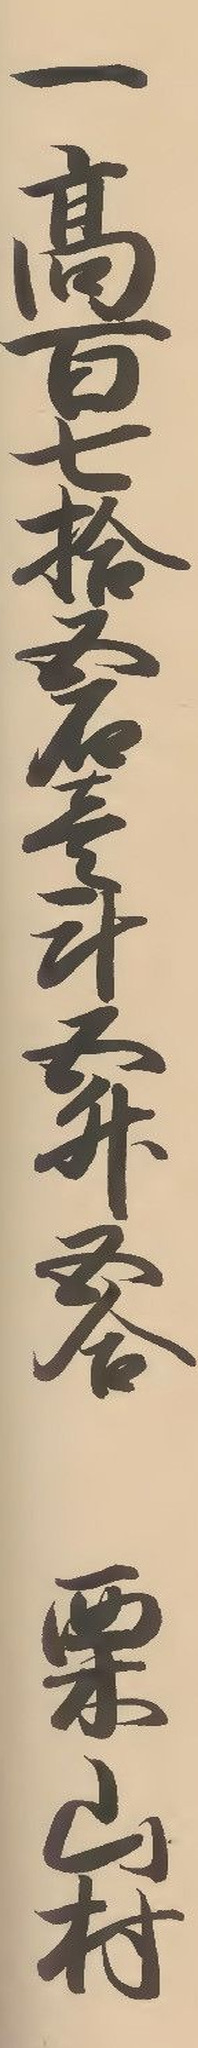一高百七拾五石壱斗五升五合栗山村
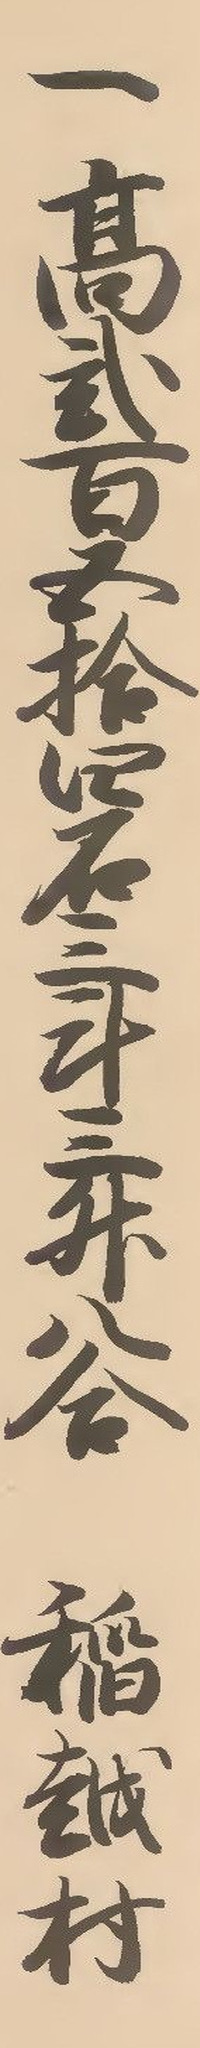一高弐百五拾四石三斗三升八合稲越村
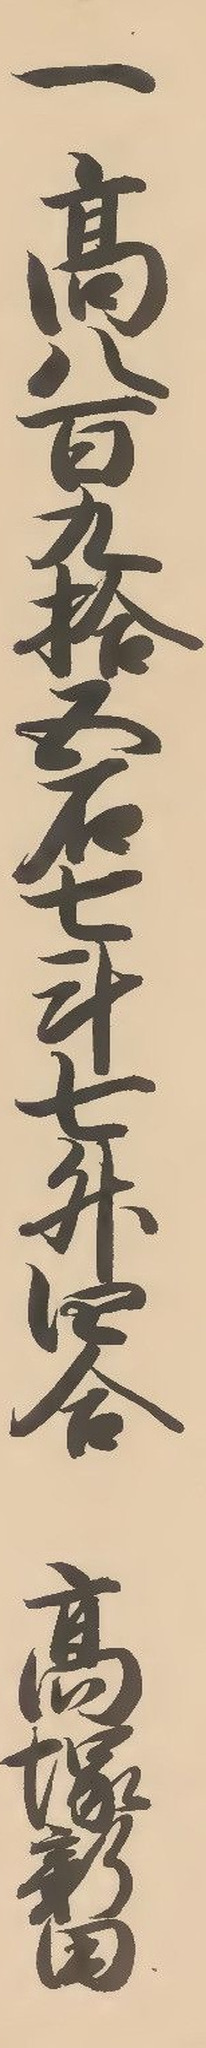一高八百九拾五石七斗七升四合高塚新田
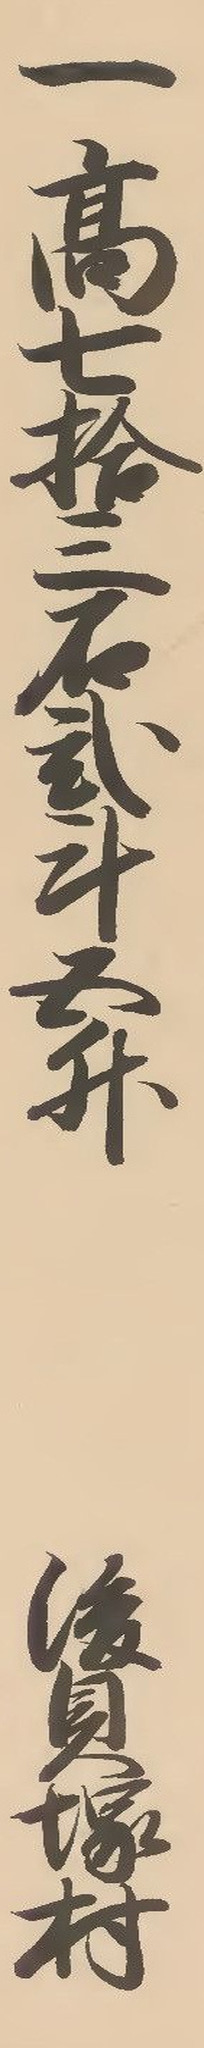一高七拾三石弐斗五升後貝塚村
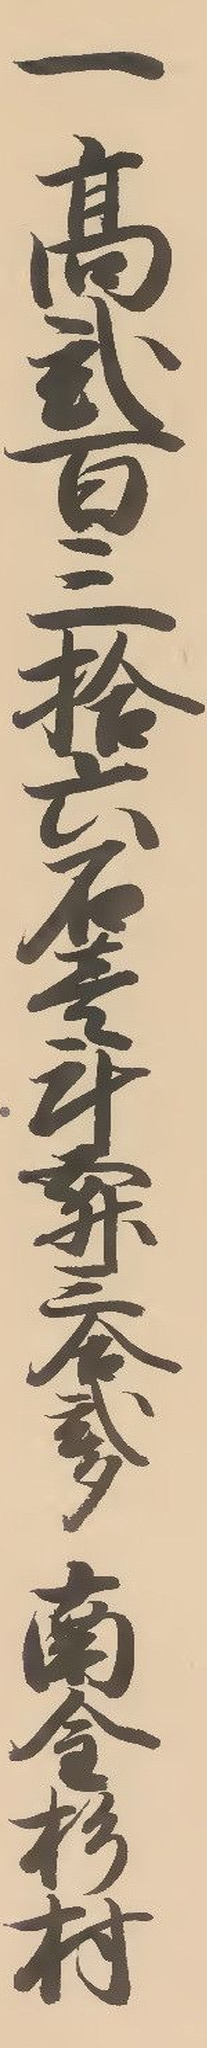一高弐百三拾六石壱斗五升三合弐勺南金杉村

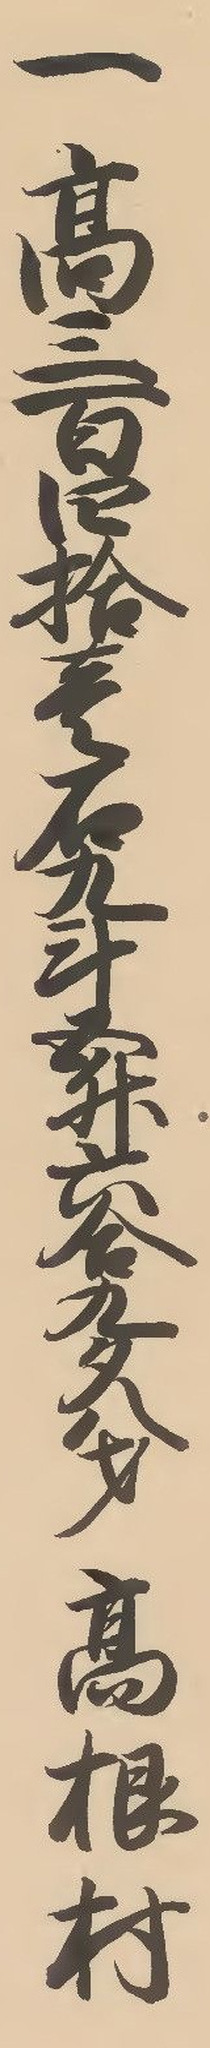一高三百四拾壱石九斗五升六合九勺八才高根村
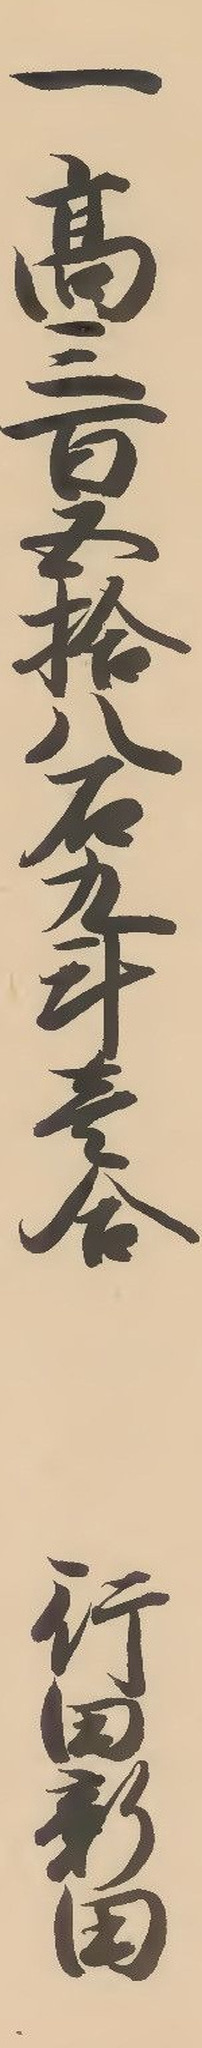一高三百五拾八石九斗壱合行田新田
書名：下総国郷帳
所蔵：国立公文書館 National Archives of Japan
